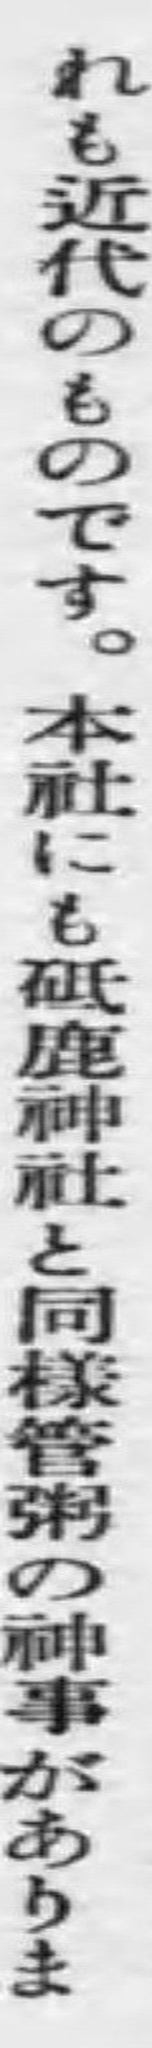れも近代のものです。本社にも砥鹿神社と同様管粥の神事がありま
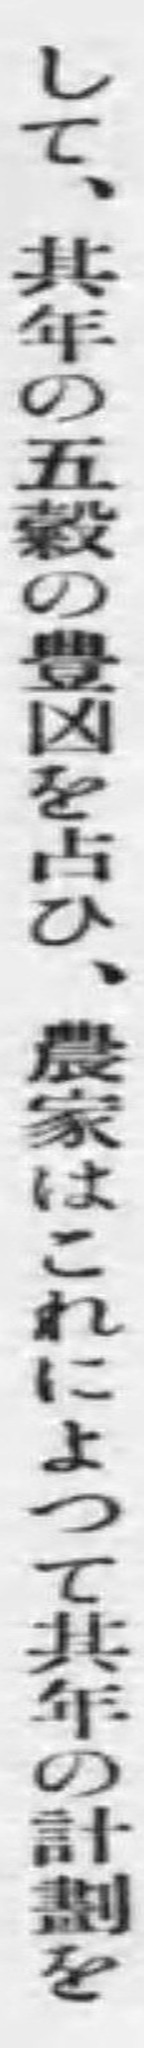して、其年の五穀の豊凶を占ひ、農家はこれによつて其年の計画を
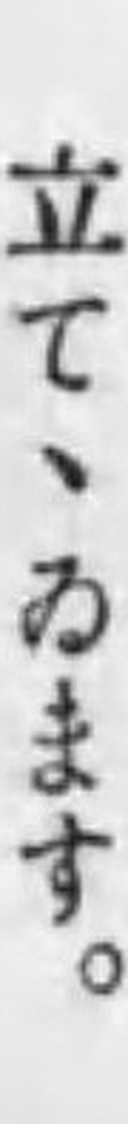立てゝゐます。
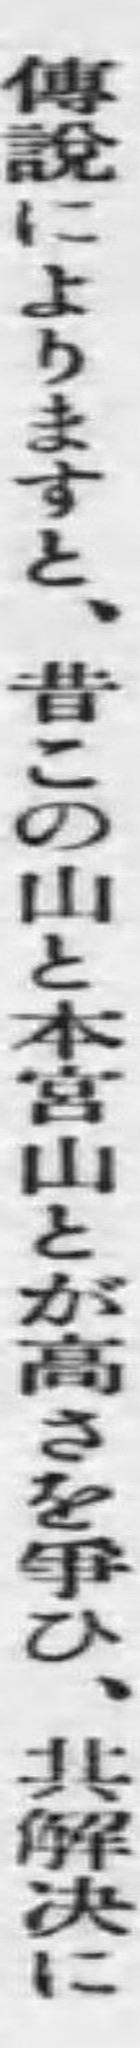伝説によりますと、昔この山と本宮山とが高さを争ひ、其解決に
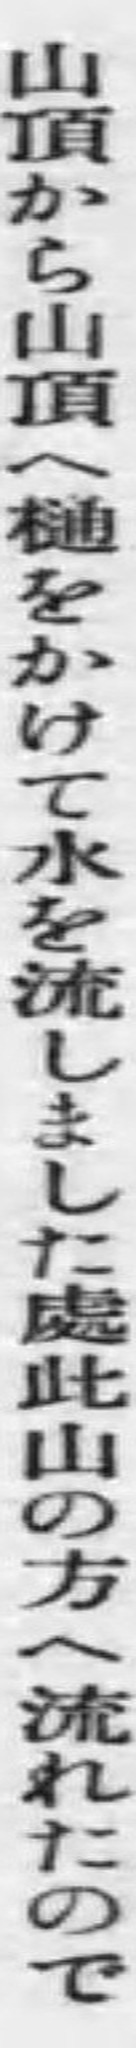山頂から山頂へ樋をかけて水を流しました処此山の方へ流れたので
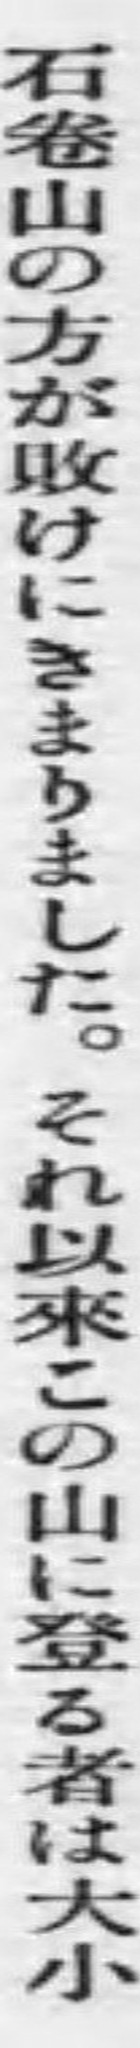石巻山の方が敗けにきまりました。それ以来この山に登る者は大小
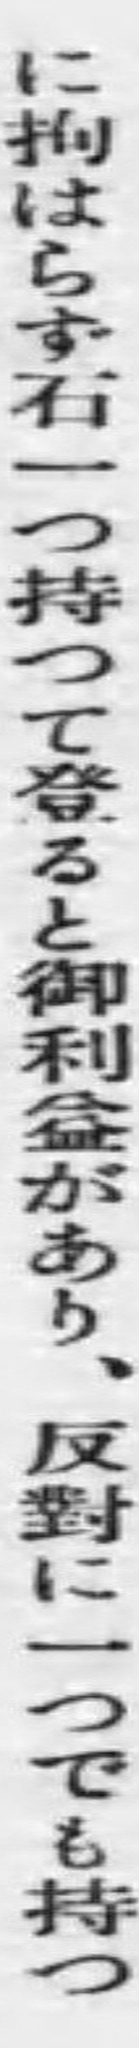に拘はらず石一つ持つて登ると御利益があり、反対に一つでも持つ
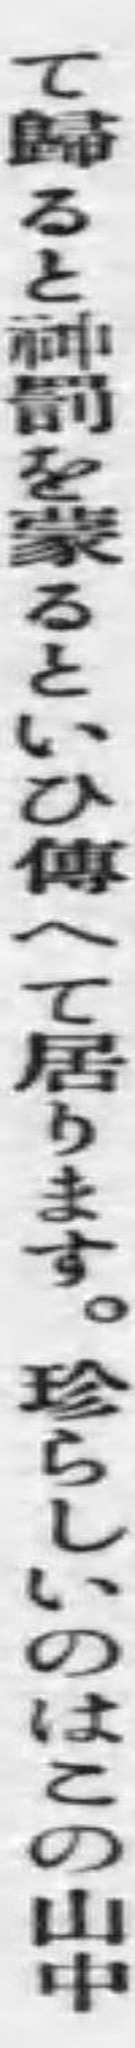て帰ると神罰を蒙るといひ伝へて居ります。珍らしいのはこの山中
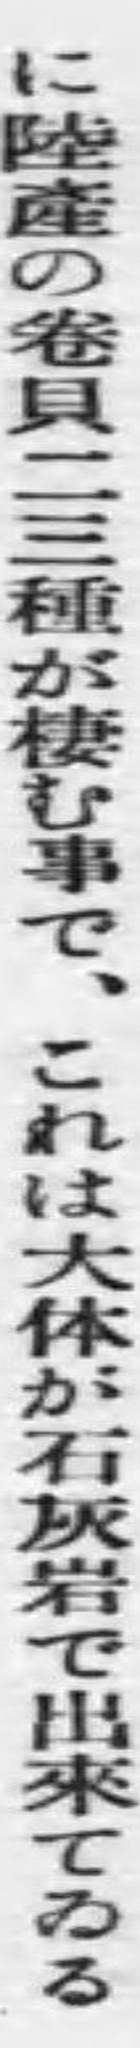に陸産の巻貝二三種が棲む事で、これは大体が石灰岩で出来てゐる
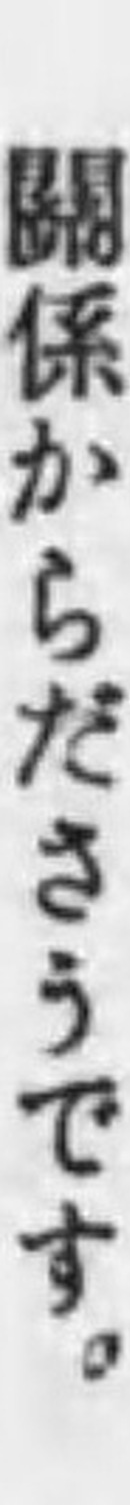関係からださうです。
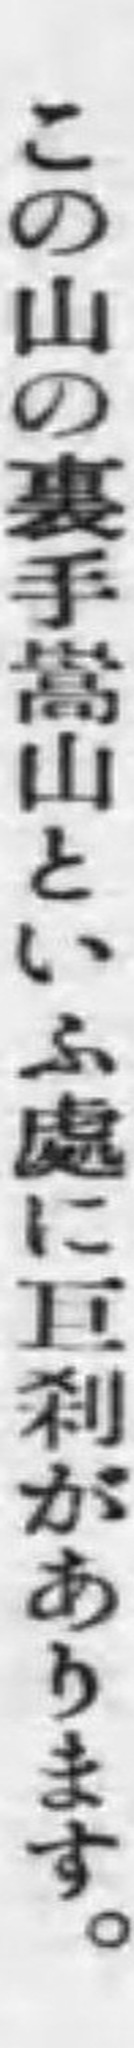この山の裏手嵩山といふ処に巨刹があります。
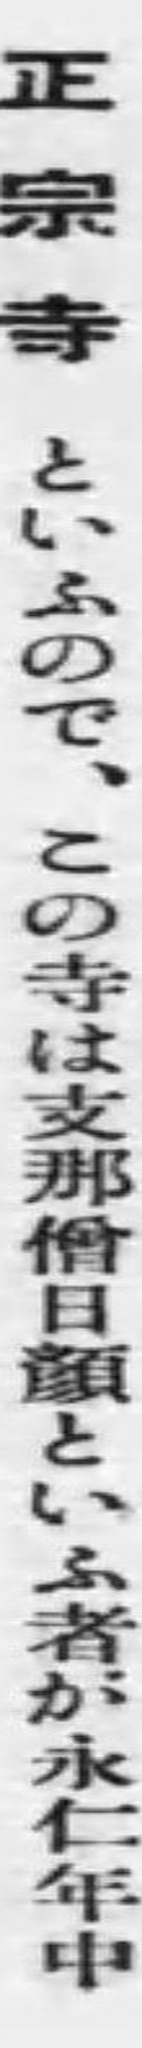正宗寺といふので、この寺は支那僧日顔といふ者が永仁年中
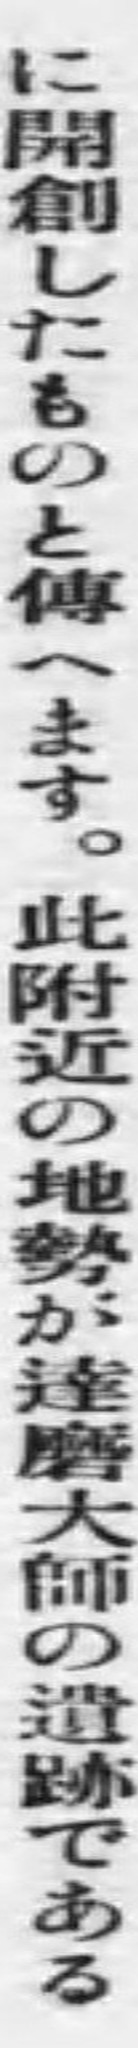に開創したものと伝へます。此附近の地勢が達磨大師の遺跡である
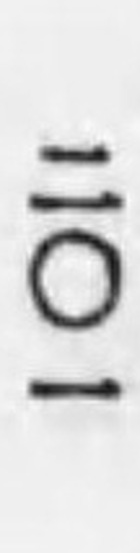二〇一

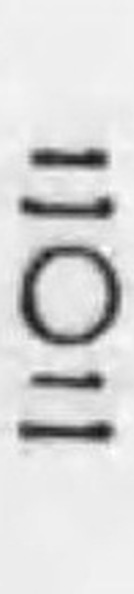二〇二
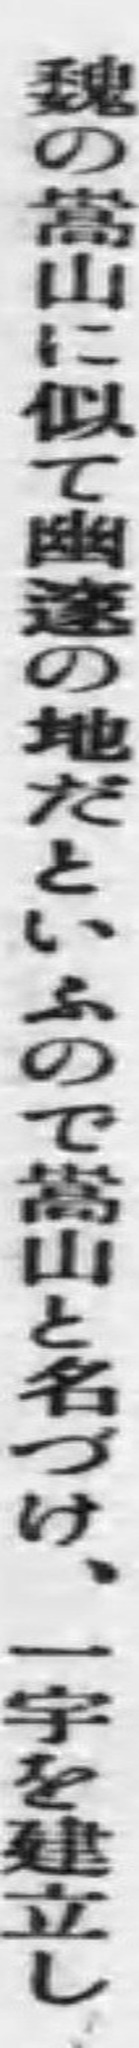魏の嵩山に似て幽邃の地だといふので嵩山と名づけ、一宇を建立し
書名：東三河道中記 : 豊橋市及其附近案内
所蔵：国立国会図書館 National Diet Library, JAPAN
